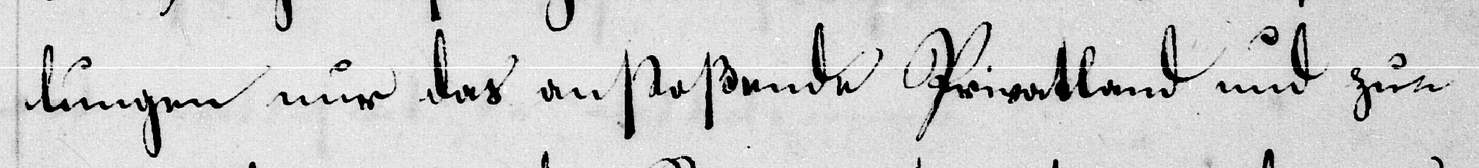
lungen nur das anstoßende Privatland und zu¬
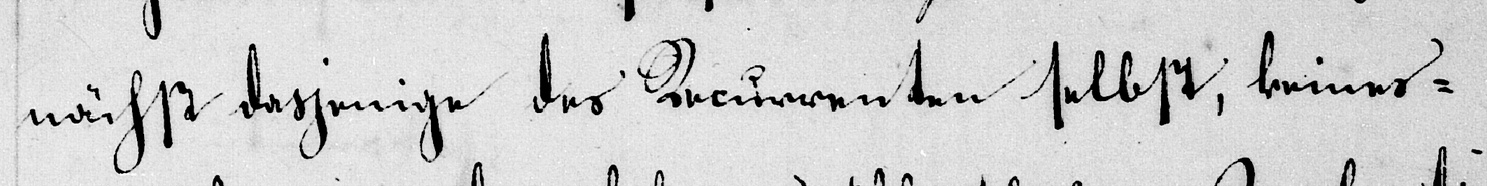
nächst dasjenige des Recurrenten selbst, keines¬
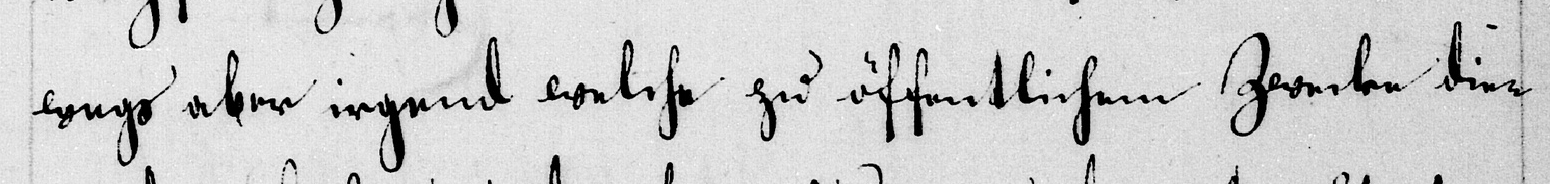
wegs aber irgend welche zu öffentlichem Zwecke die¬
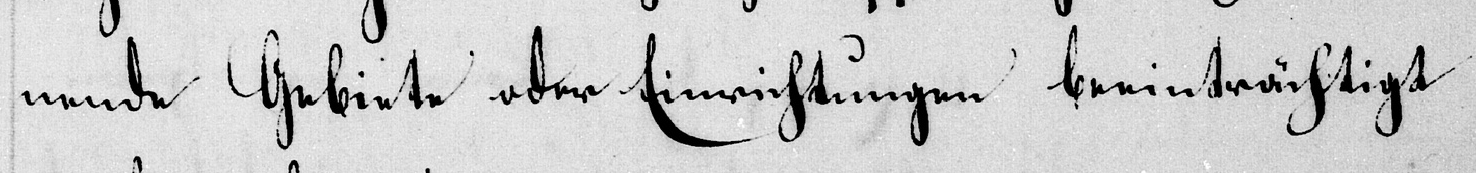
nende Gebiete oder Einrichtungen beeinträchtigt
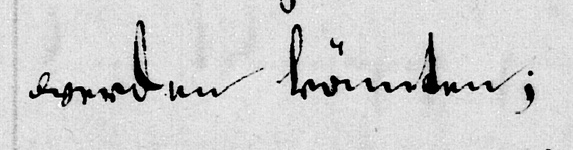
werden könnten;
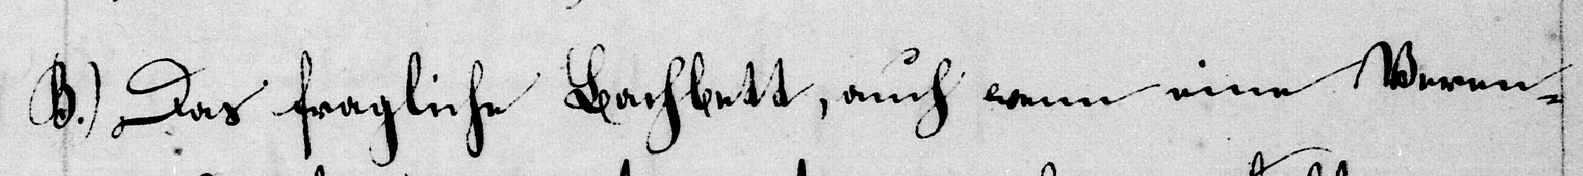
B.) Das fragliche Bachbett, auch wenn eine Veren¬
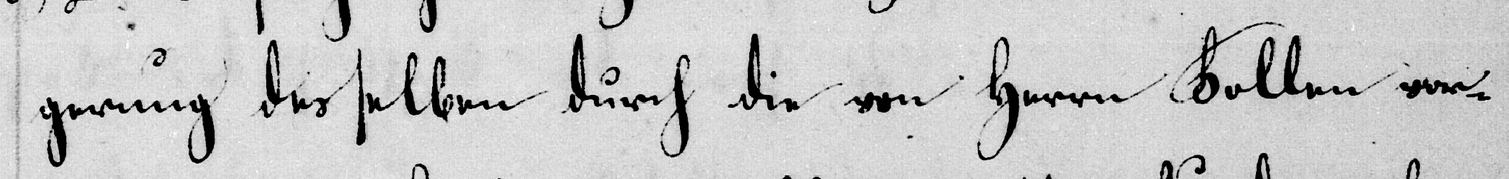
gerung desselben durch die von Herrn Follen vor¬
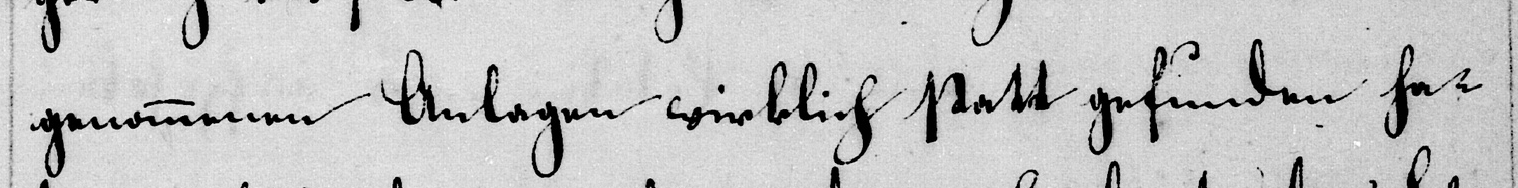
genommenen Anlagen wirklich statt gefunden ha¬
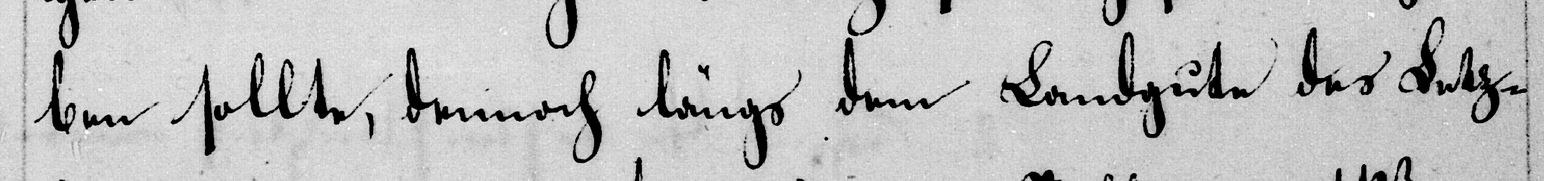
ben sollte, dennoch längs dem Landgute des Letz¬
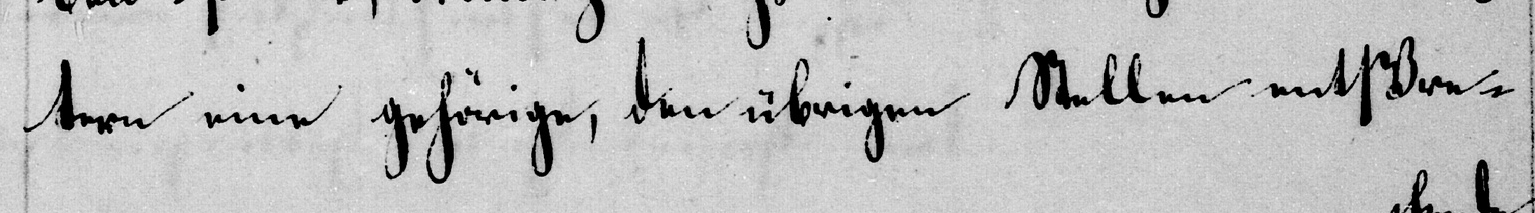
tern eine gehörige, den übrigen Stellen entspre-
